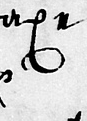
des
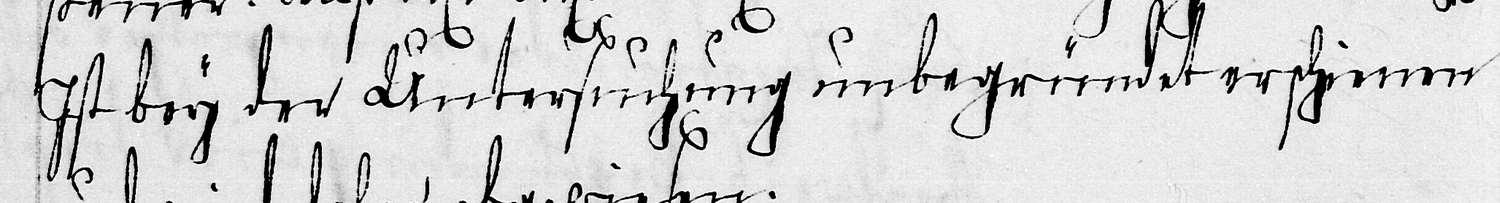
Ist bey der Untersuchung unbegründet erschienen
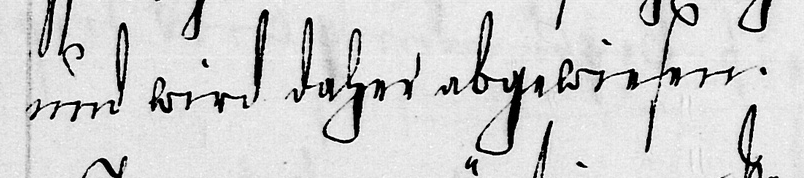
und wird daher abgewiesen.
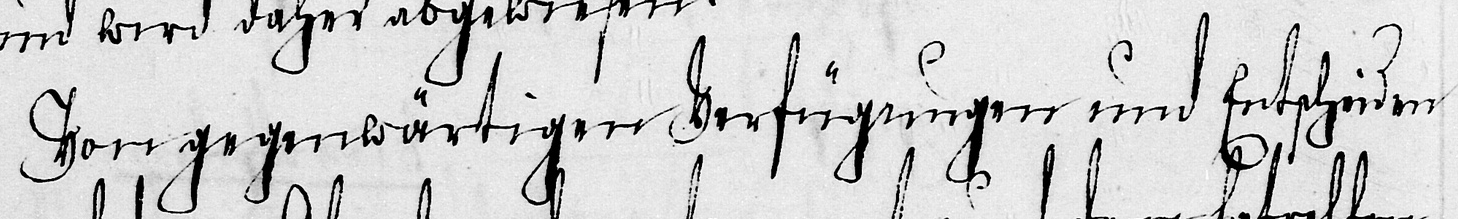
Von gegenwärtigen Verfügungen und Entscheiden
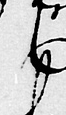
40.
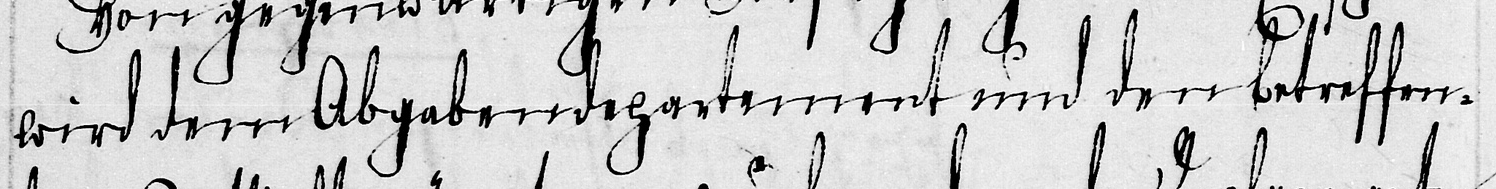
wird dem Abgabendepartement und den betreffen¬
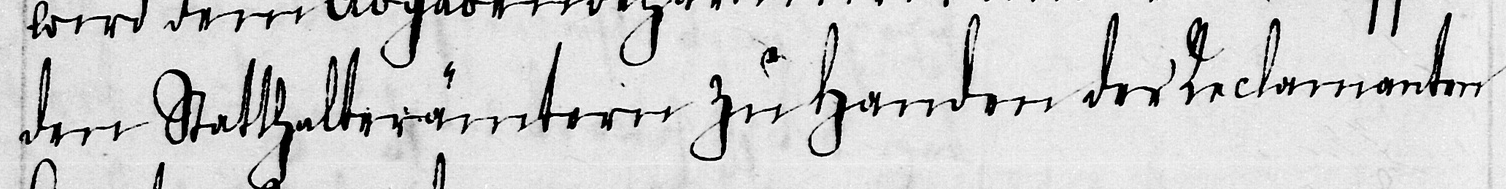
den Statthalterämtern zu Handen der Reclamanten
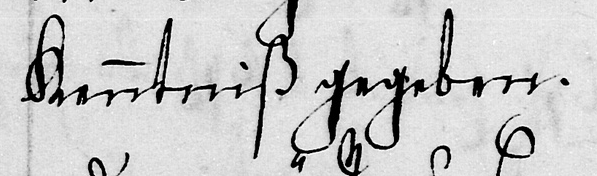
Kenntniß gegeben.
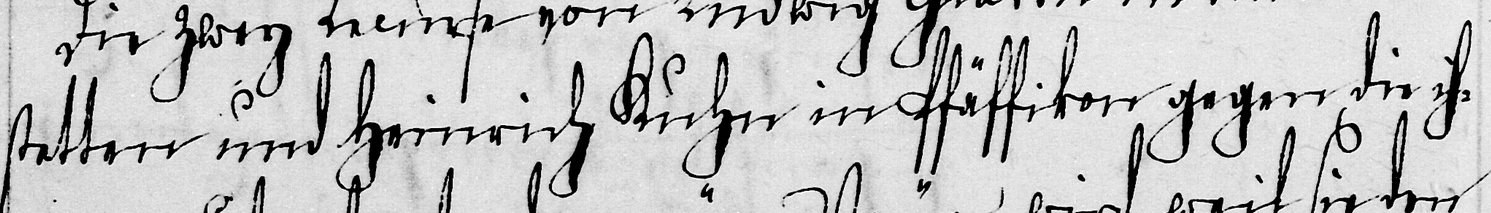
tetten und Heinrich Kuhn in Pfäffikon gegen die i¬
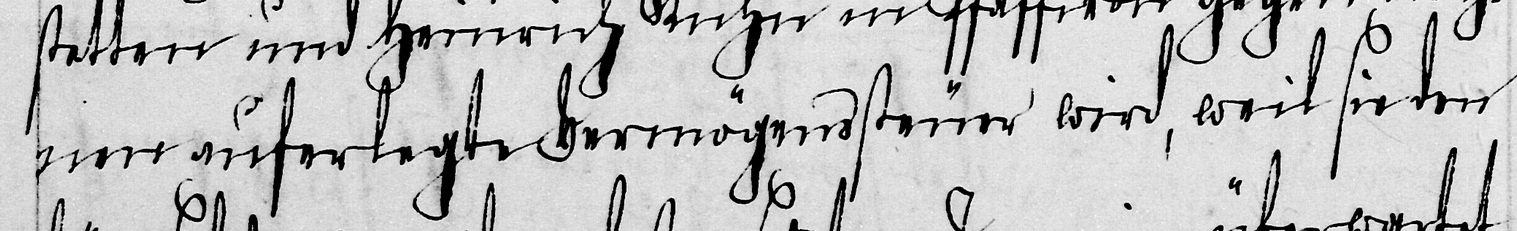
hnen auferlegte Vermögenssteuer wird, weil sie den
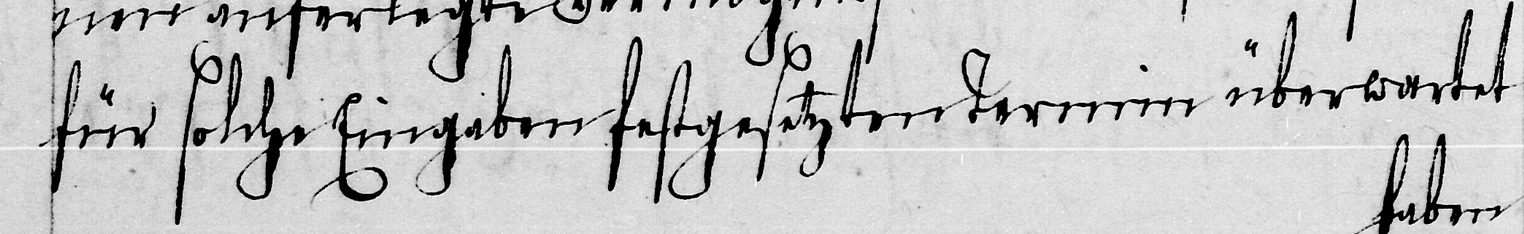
für solche Eingaben festgesetzten Termin überwartet
